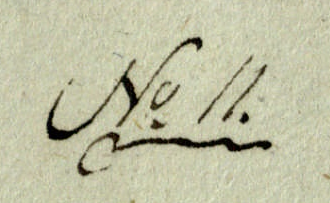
No 11.
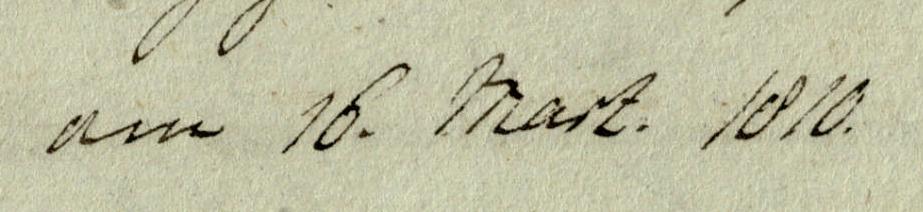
am 16. Mart. 1810.
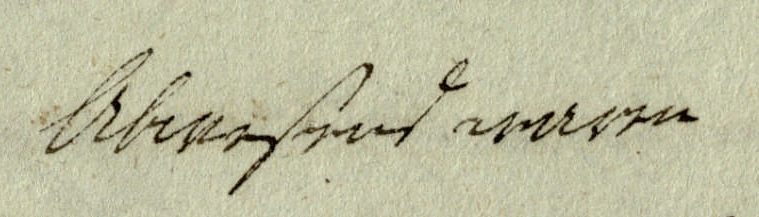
Abwesend waren
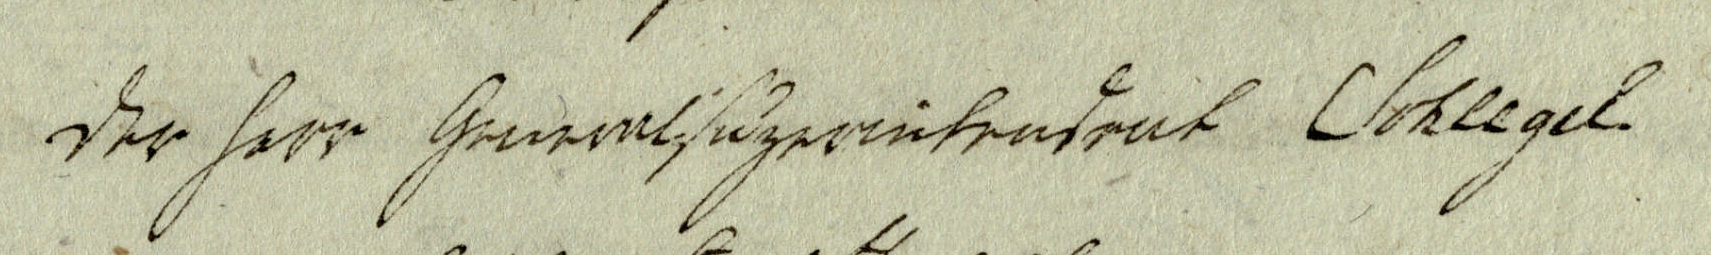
der Herr Generalsuperintendent Schlegel.
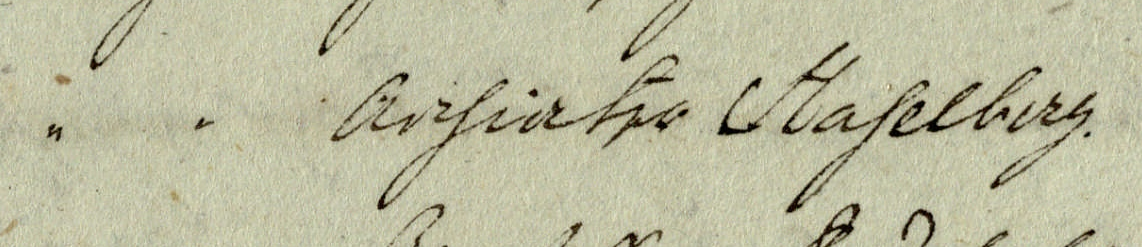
Archiater Haselberg.
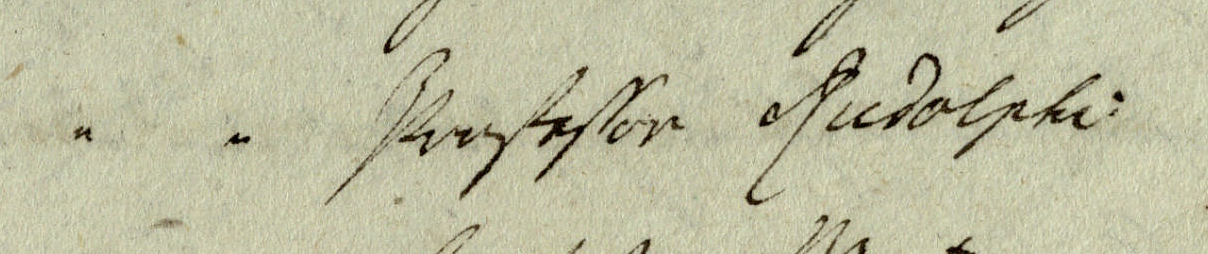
Professor Rudolphi.
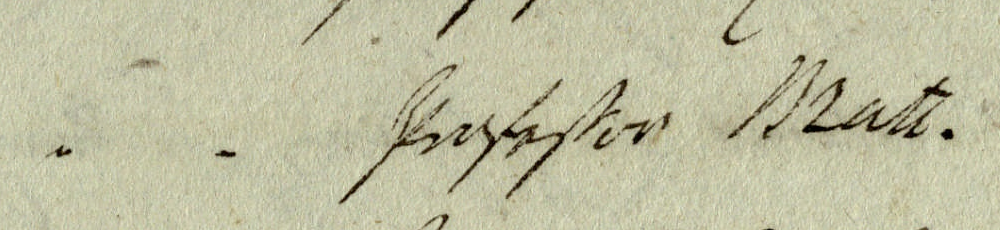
Professor Bratt.
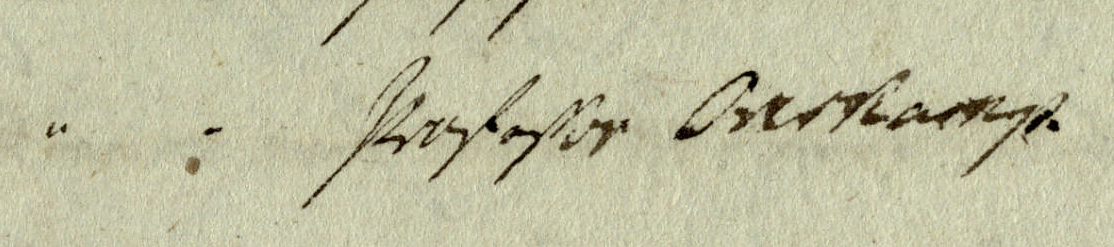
Professor Overkamp.
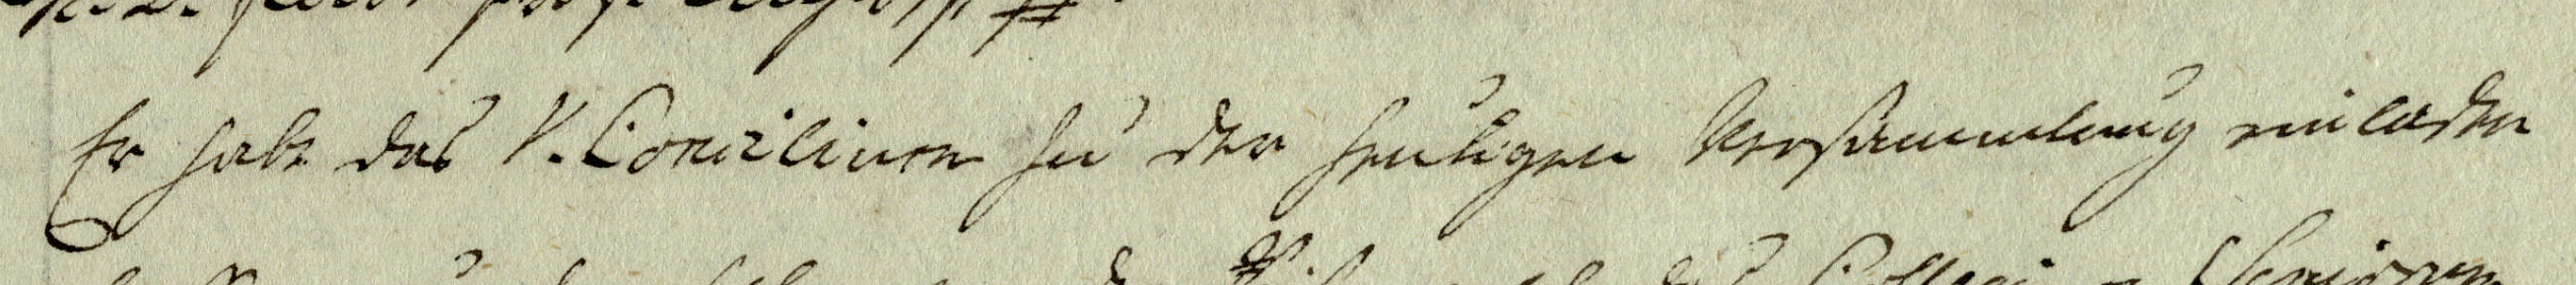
Er habe das V. Concilium zu der heutigen Versammlung einladen
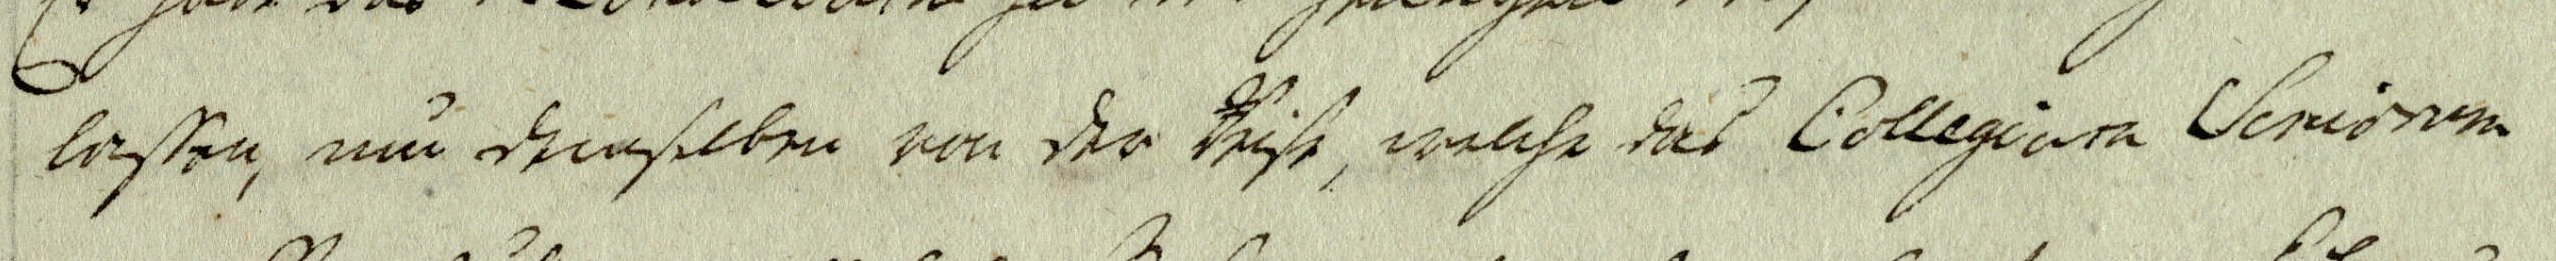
lassen, um demselben von der Reise, welche das Collegium Seniorum
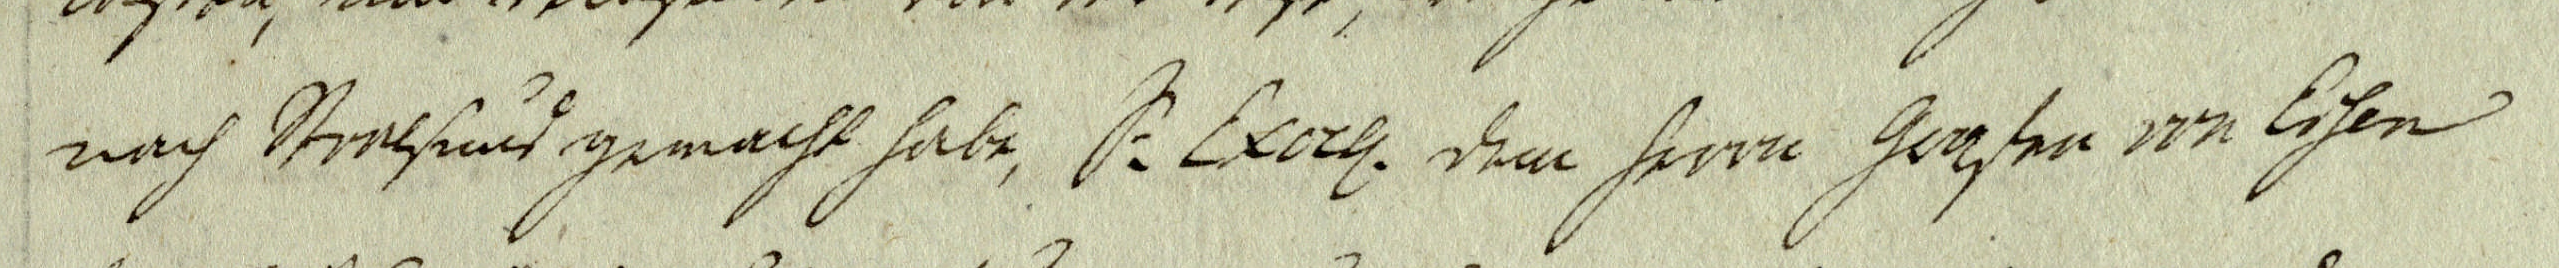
nach Stralsund gemacht habe, Sr Excell. dem Herrn Grafen von Essen
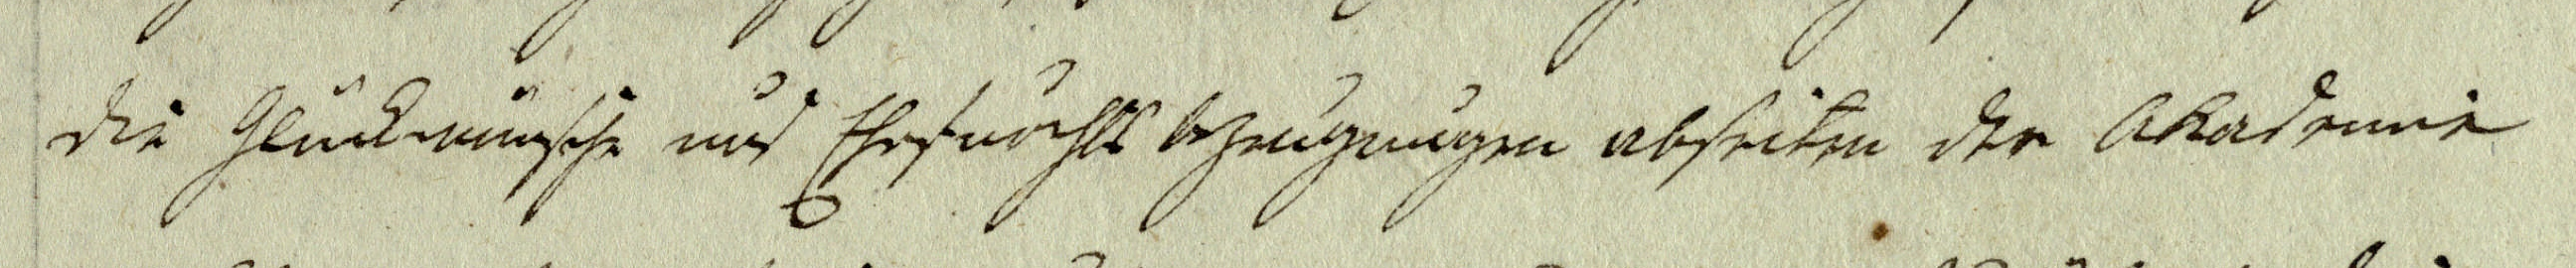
die Glückwünsche und Ehrfurchtsbezeugungen abseiten der Akademie
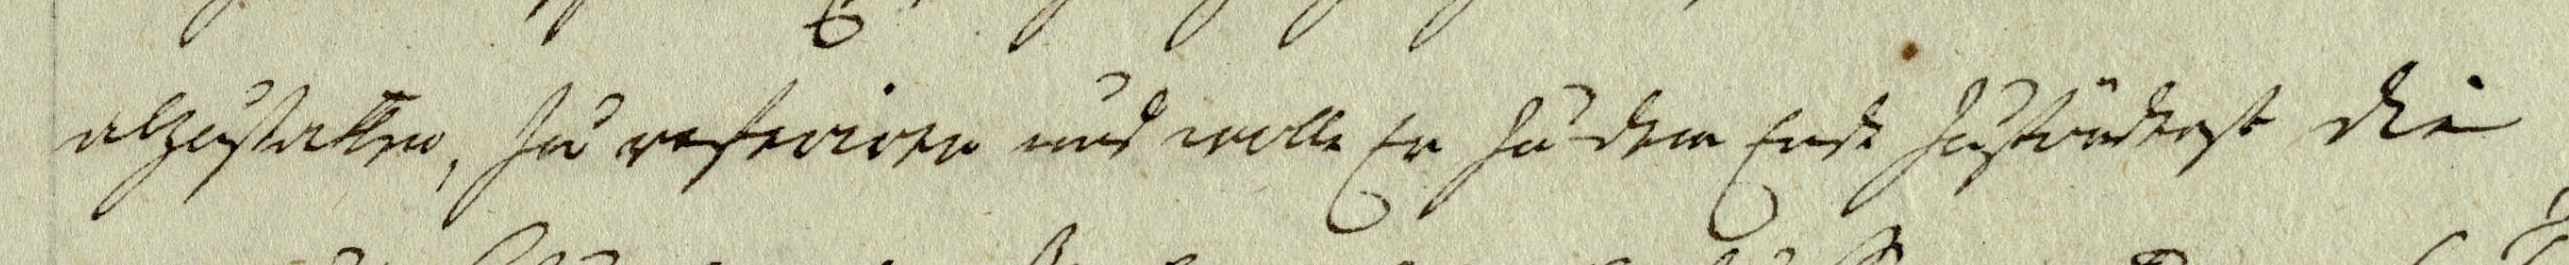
abzustatten, zu referiren und wolle Er zu dem Ende zuförderst die
